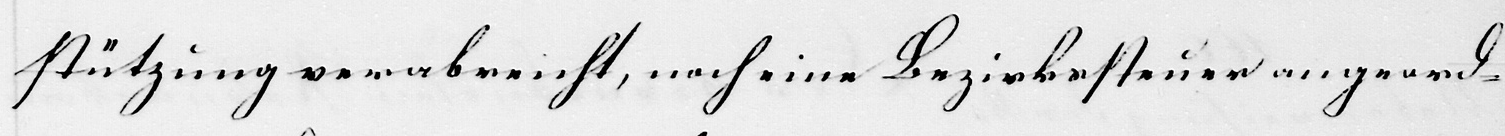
stützung verabreicht, noch eine Bezirkssteuer angeord¬
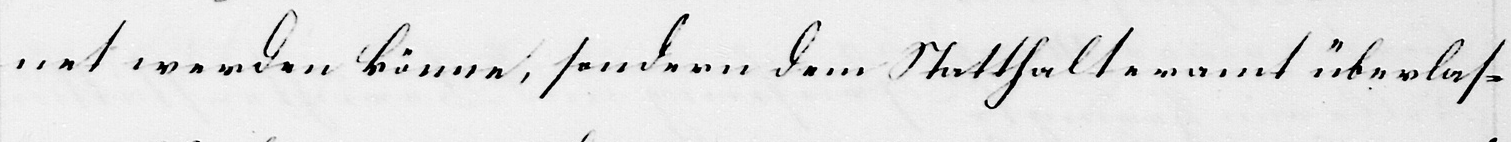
net werden könne, sondern dem Statthalteramt überlas¬
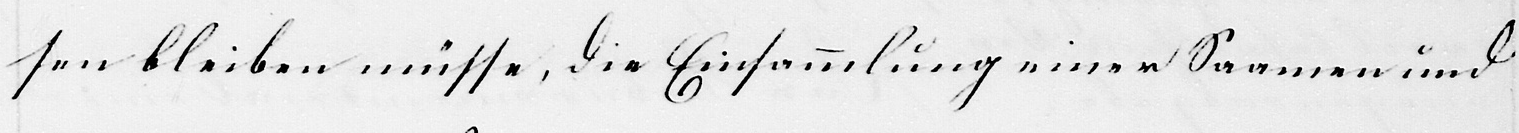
sen bleiben müsse, die Einsammlung einer Saamen und
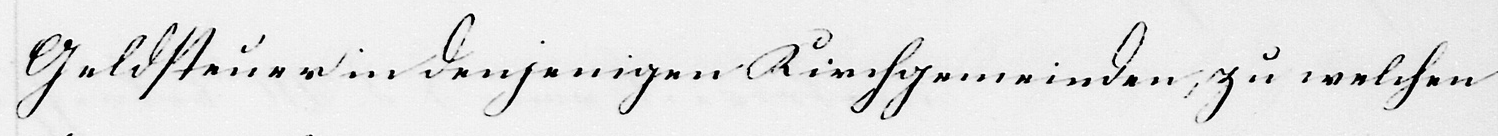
Geldsteuer in denjenigen Kirchgemeinden zu welchen
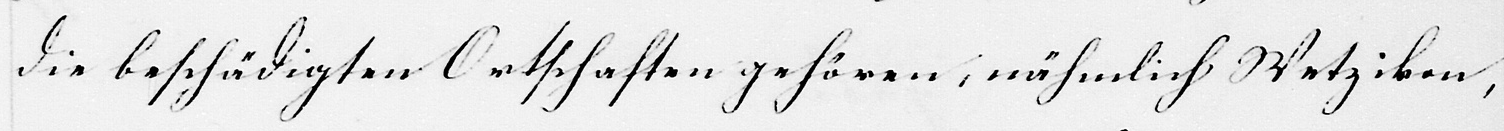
die beschädigten Ortschaften gehören, nämlich Wetzikon,
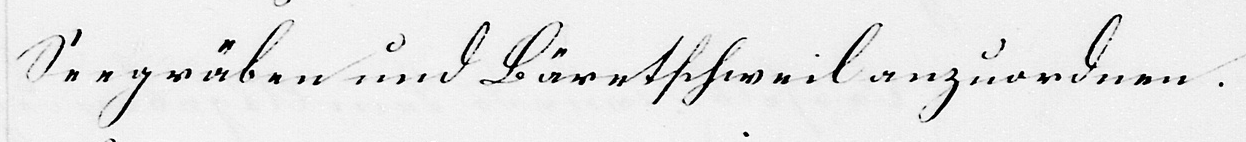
Seegräben und Bärentschweil anzuordnen.
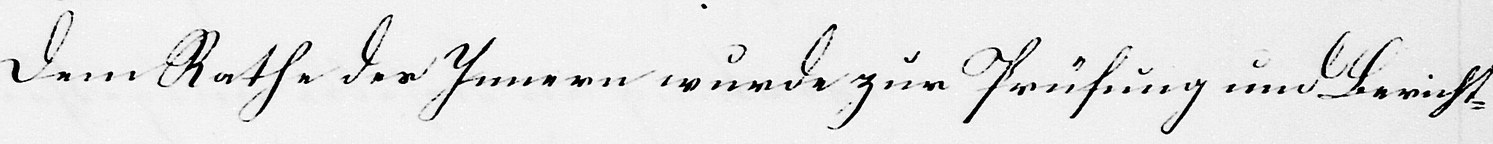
Dem Rathe des Innern wurde zur Prüfung und Bericht¬
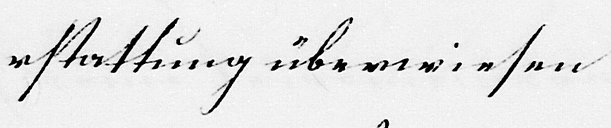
erstattung überwiesen
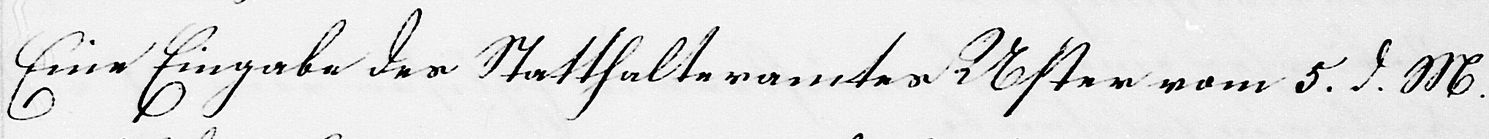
Eine Eingabe des Statthalteramtes Uster vom 5. d. M.
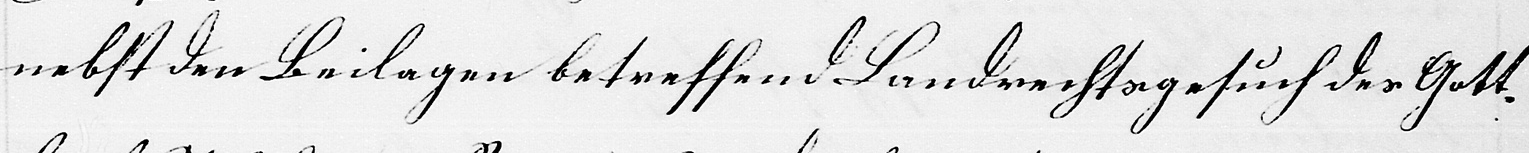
nebst den Beilagen betreffend Landrechtsgesuch des Gott¬
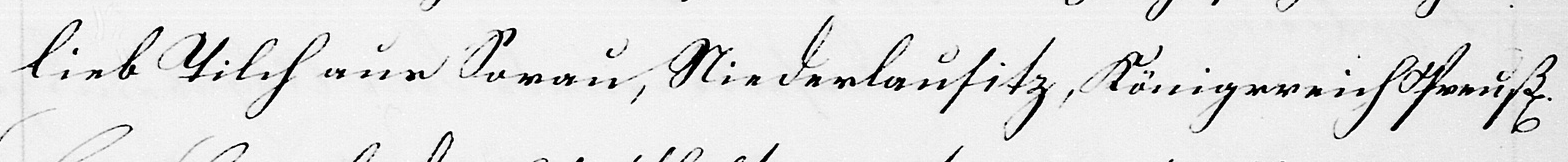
lieb Tilch aus Sorau, Niederlausitz, Königrreich Preuß[e¬
